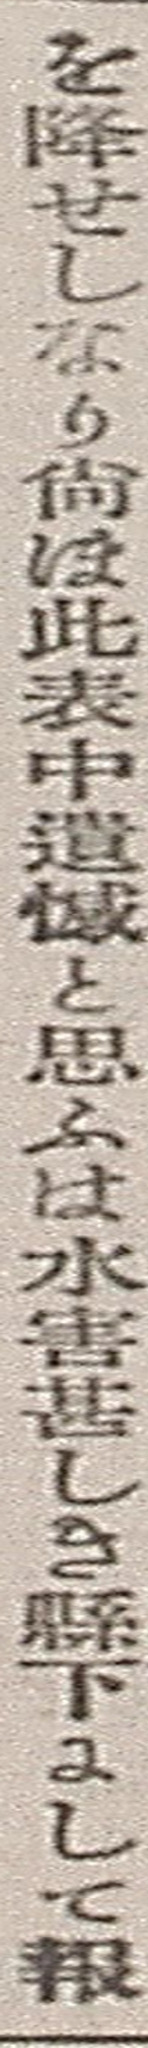を降せしなり尚ほ此表中遺憾と思ふは水害甚しき県下にして報
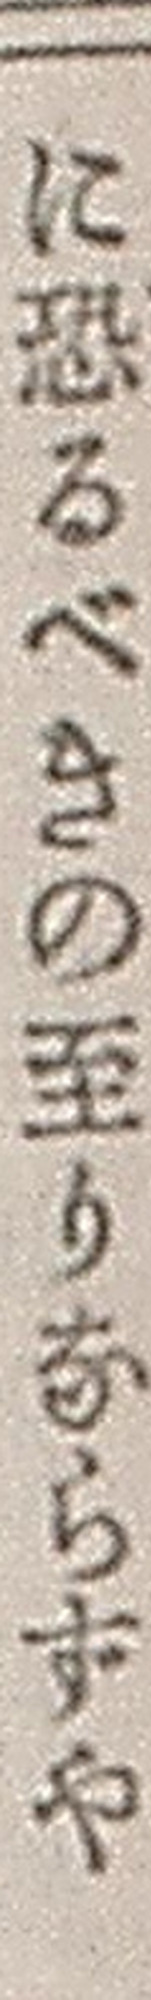に恐るべきの至りならずや
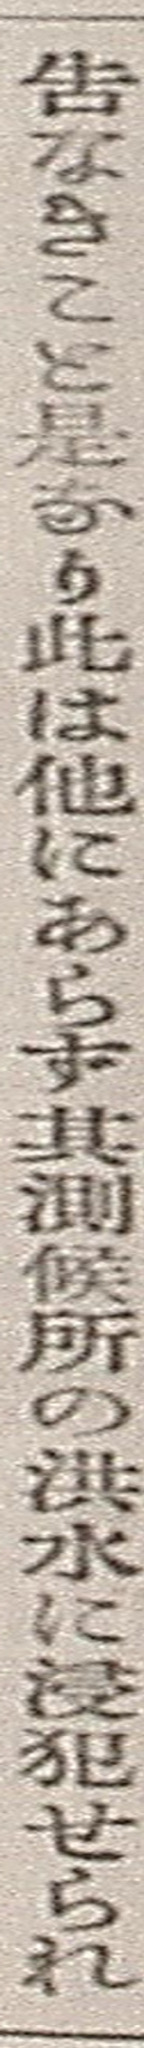告なきこと是なり此は他にあらず其測候所の洪水に浸犯せられ
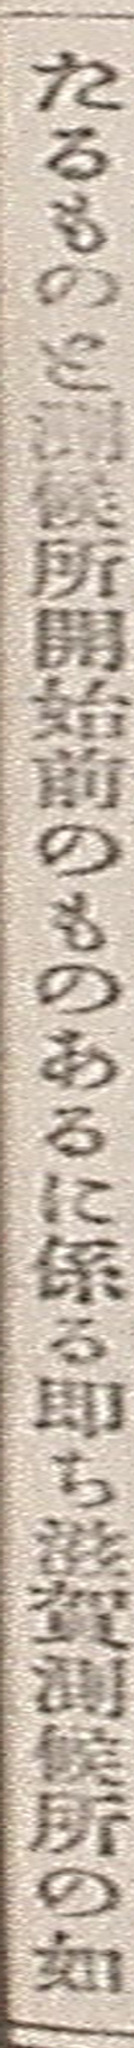たるものと測候所開始前のものあるに係る即ち滋賀測候所の如
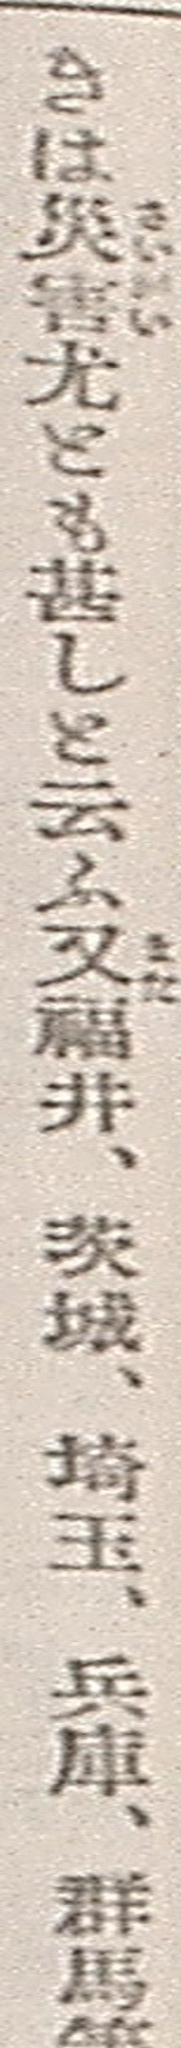きは災害尤とも甚しと云ふ又福井、茨城、埼玉、兵庫、群馬等
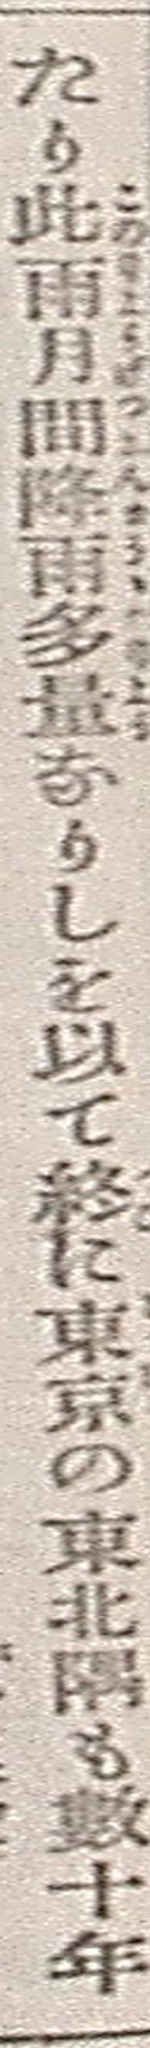たり此両月間降雨多量なりしを以て終に東京の東北隅も数十年
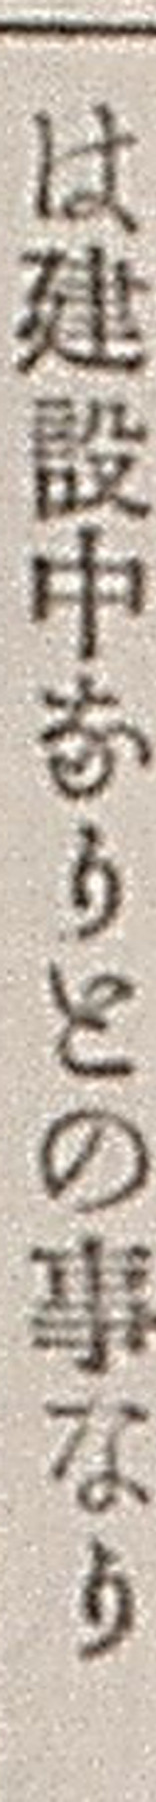は建設中なりとの事なり
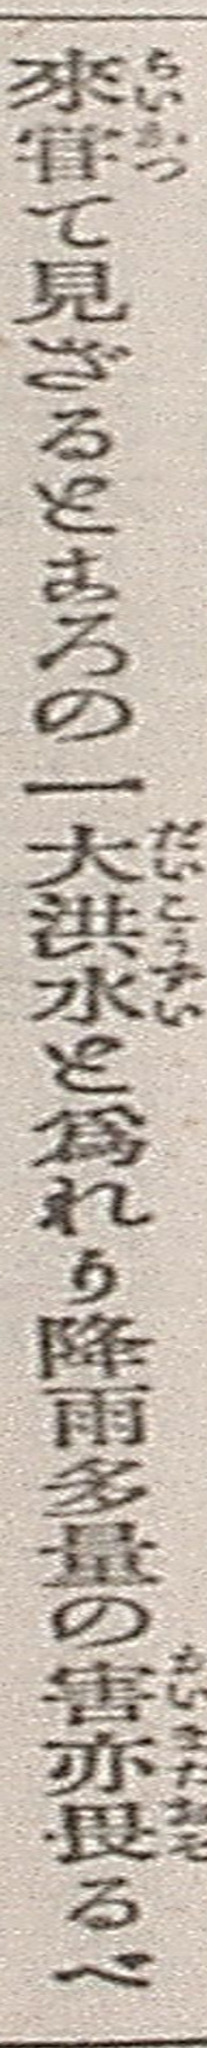来曾て見ざるところの一大洪水と為れり降雨多量の害亦畏るべ
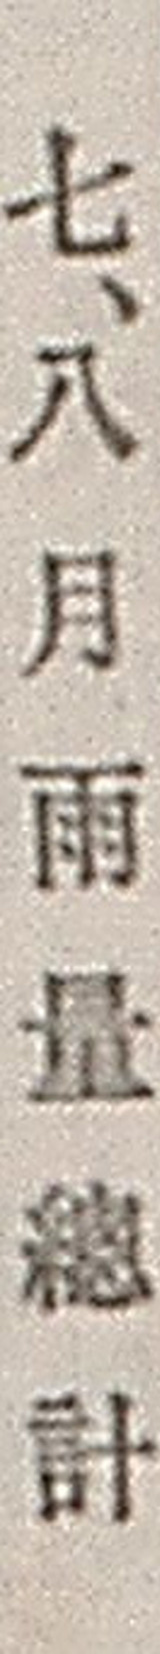七、八月雨量総計
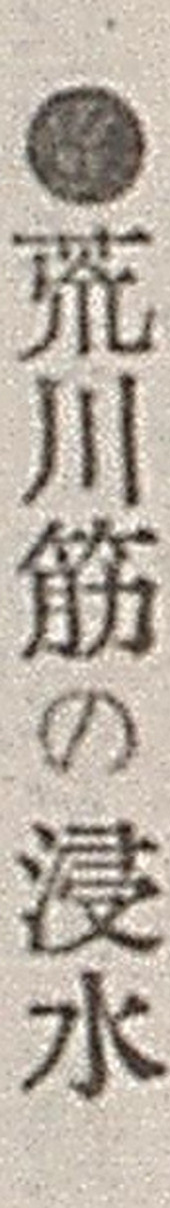●荒川筋の浸水
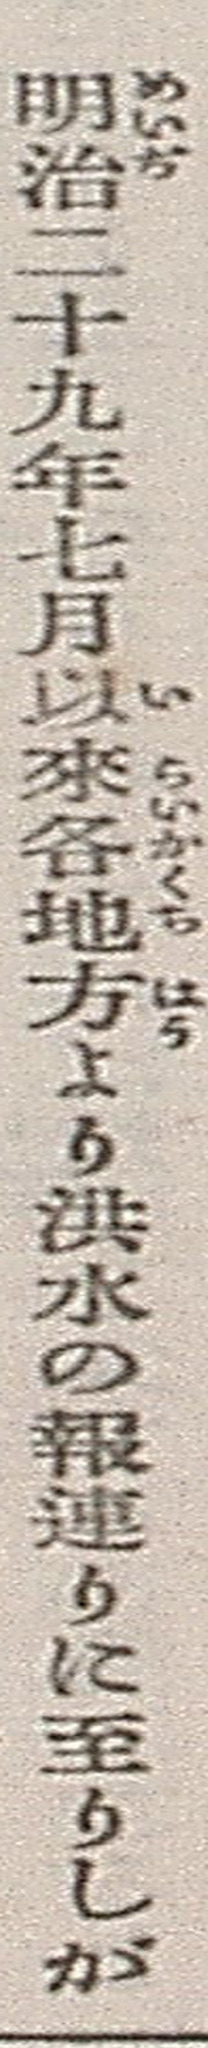明治二十九年七月以来各地方より洪水の報連りに至りしが
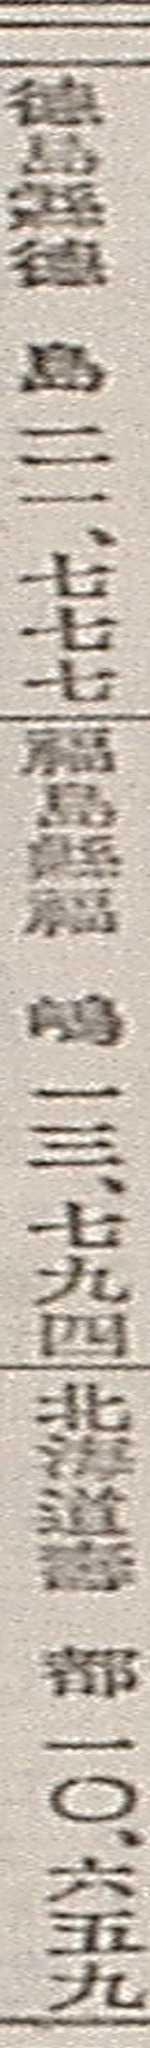徳島県徳島二一、七七七福島県福島一三、七九四北海道寿都一〇、六五九
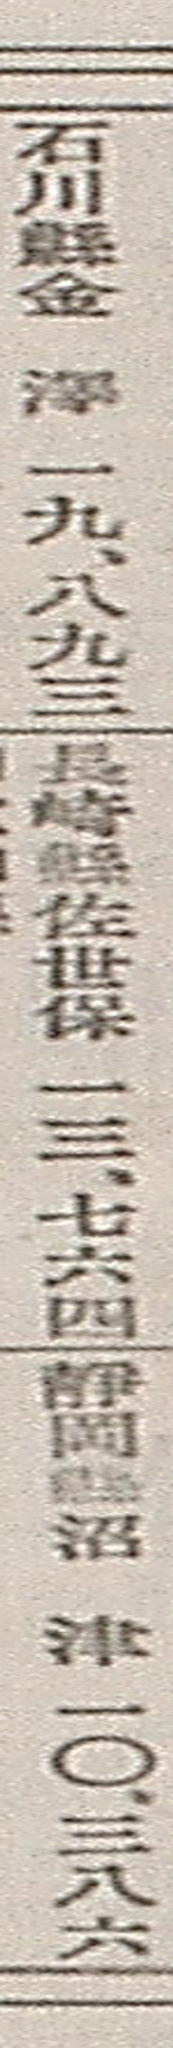石川県金沢一九、八九三長崎県佐世保一三、七六四静岡県沼津一〇、三八六
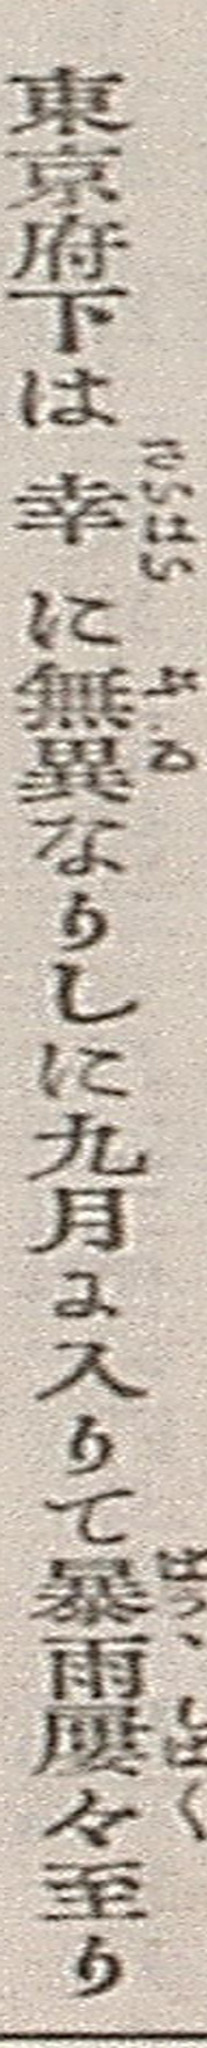東京府下は幸に無異なりしに九月に入りて暴雨屡々至り
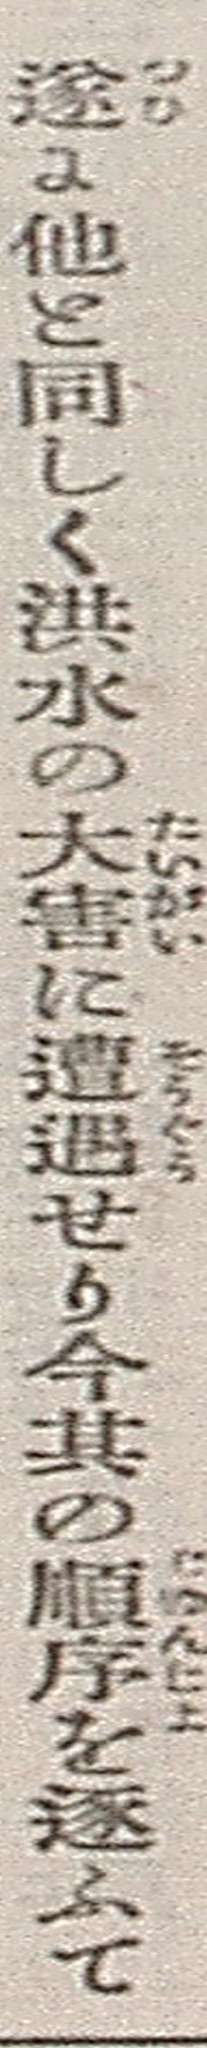遂に他と同しく洪水の大害に遭遇せり今其の順序を遂ふて
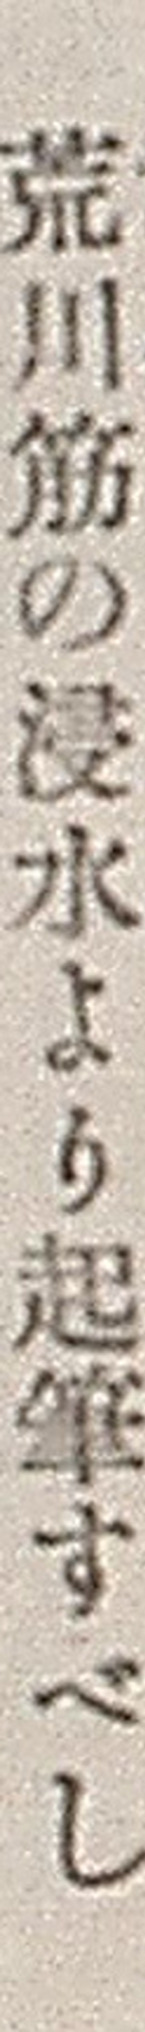荒川筋の浸水より起筆すべし
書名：風俗畫報臨時増刊第百二十四號　洪水地震被害録（上）
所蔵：東京大学地震研究所図書室 Earthquake Research Institute Library, The University of Tokyo, JAPAN
